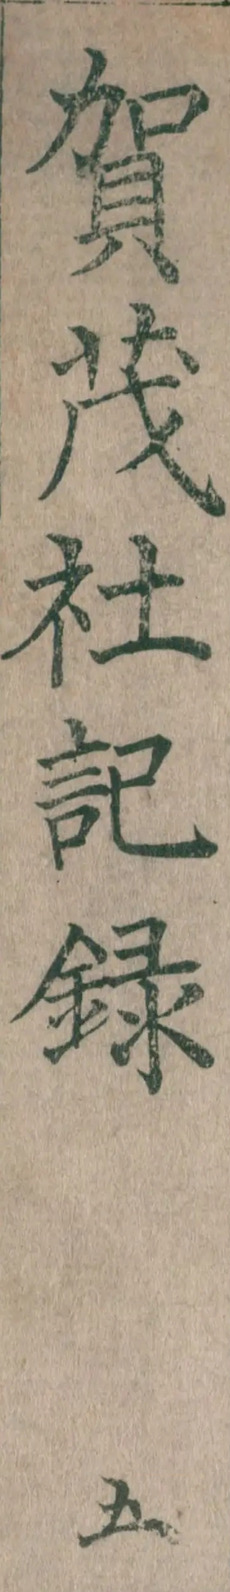賀茂社記録五

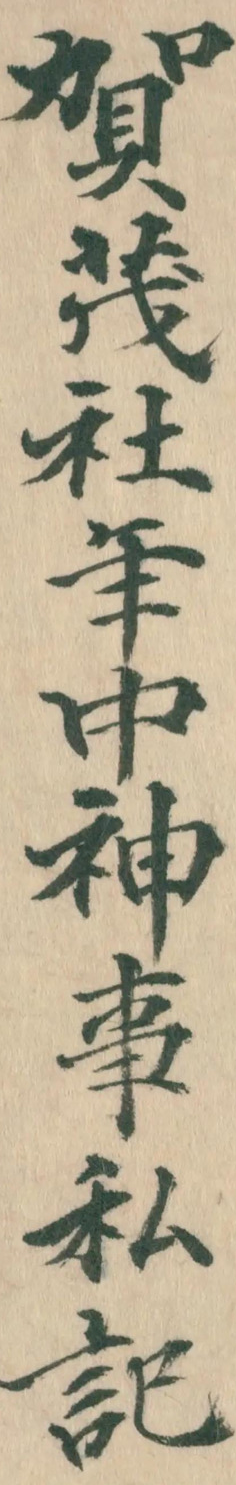賀茂社年中神事私記

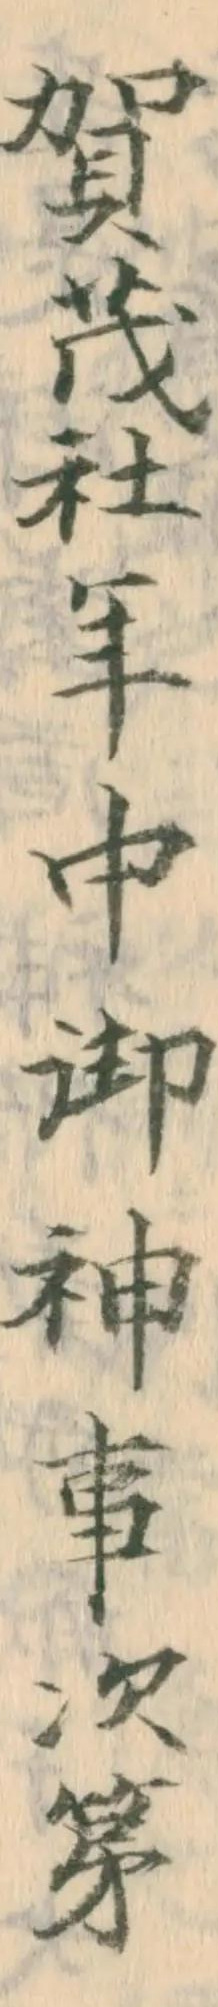賀茂社年中御神事次第
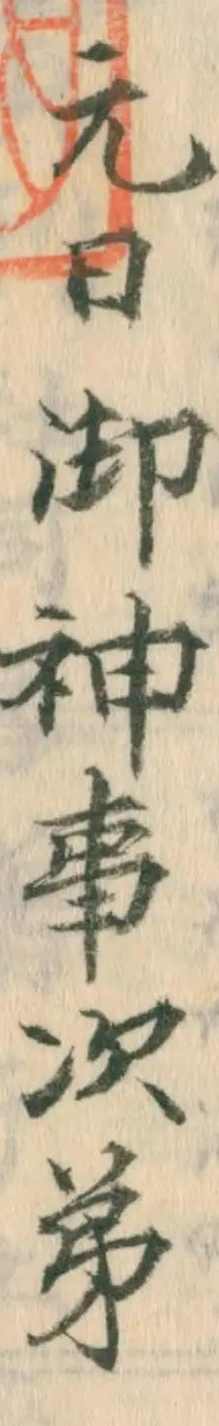元日御神事次弟
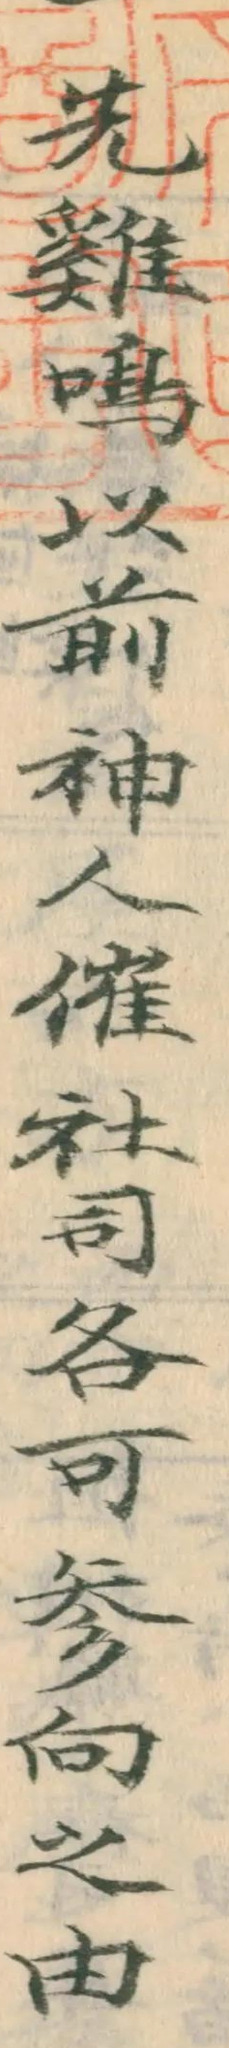一先鶏鳴以前神人催社司各可参向之由
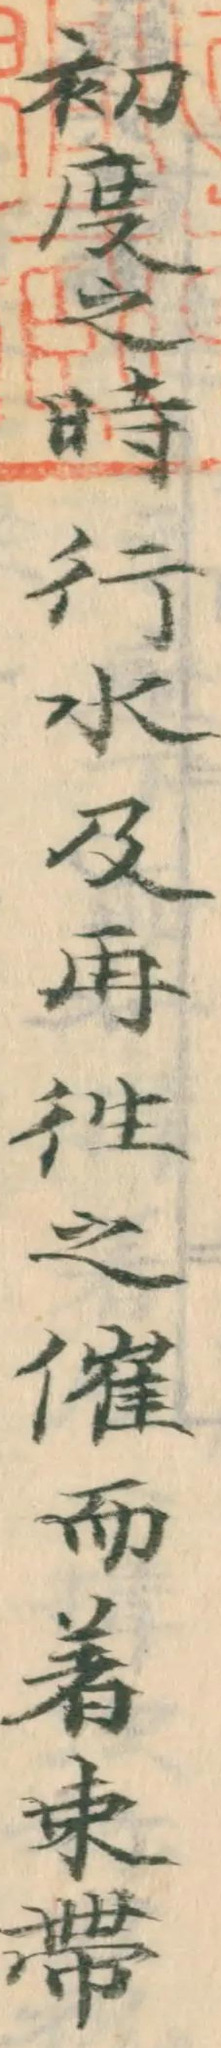初度之時行水及再往之催而着束帯
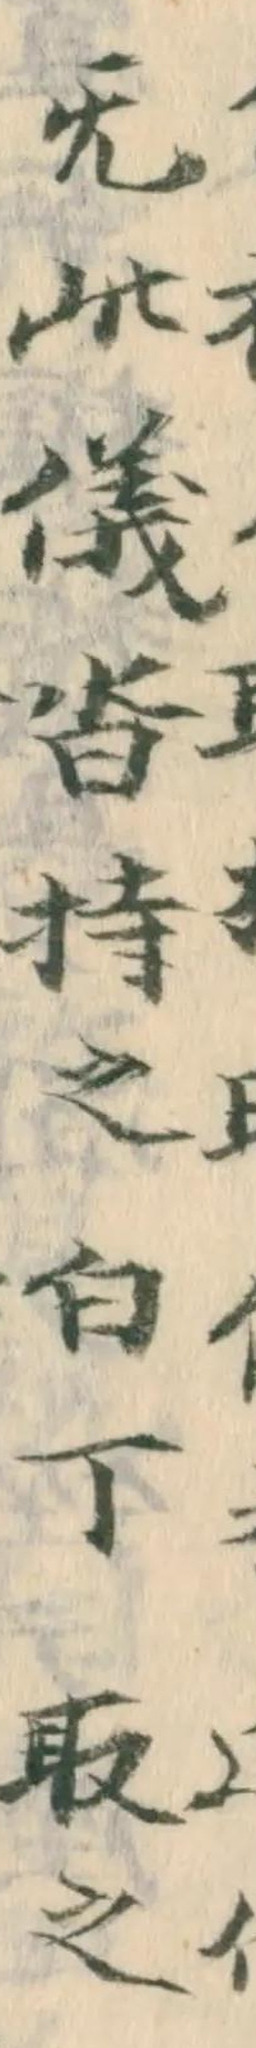無此儀沓持之白丁取之
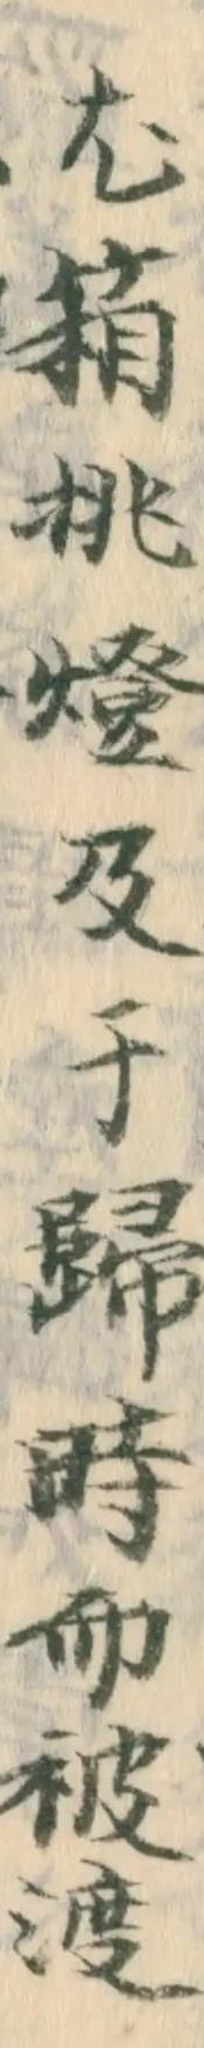尤箱桃燈及于帰時而被渡
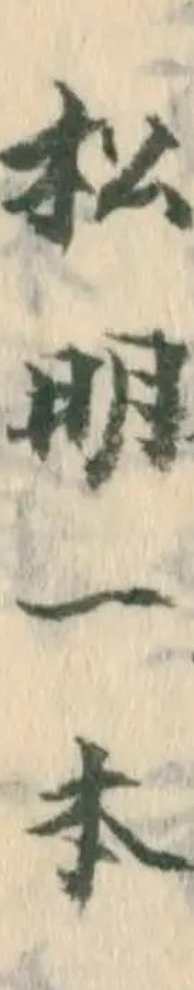松明一本
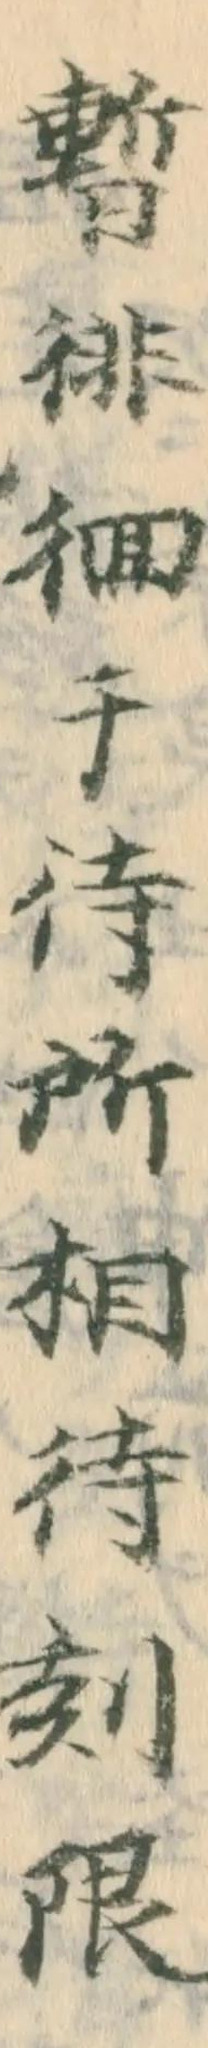暫徘徊于侍所相待刻限
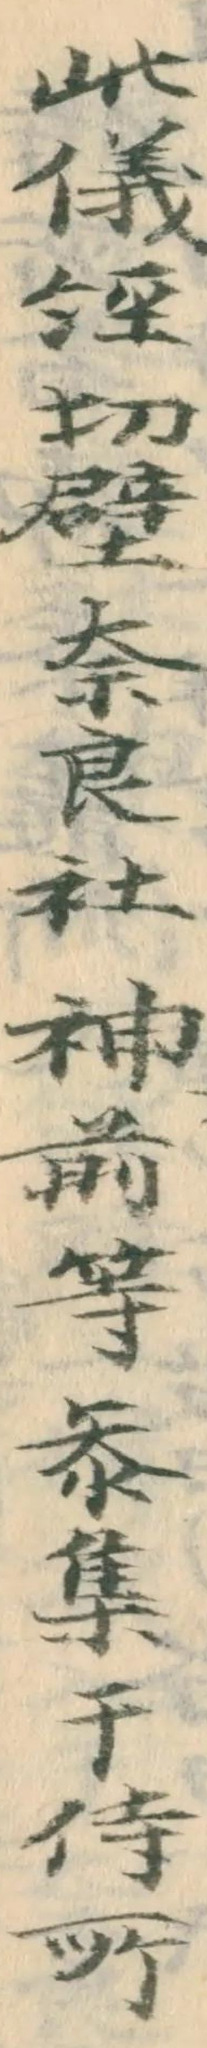此儀経切壁奈良社神前等参集于侍所

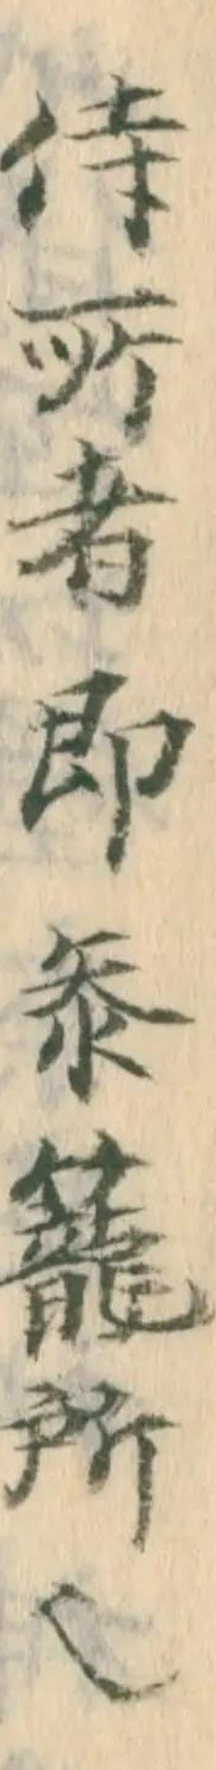侍所者即参籠所也
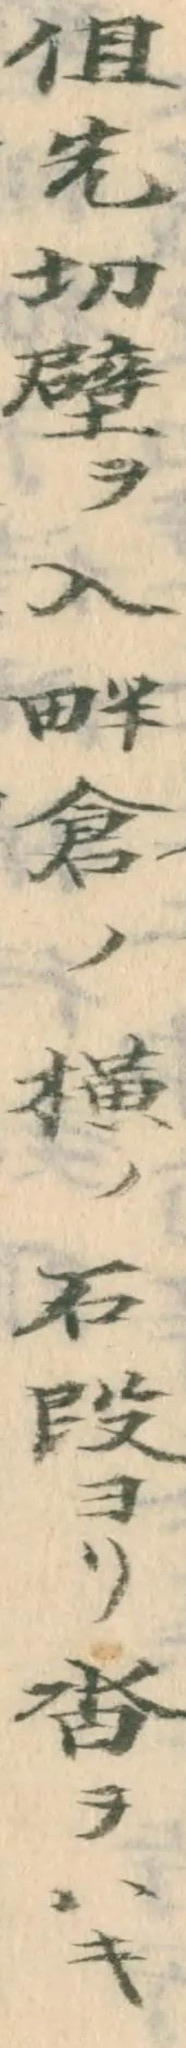但先切壁ヲ入畔倉ノ横ノ石段ヨリ沓ヲハキ
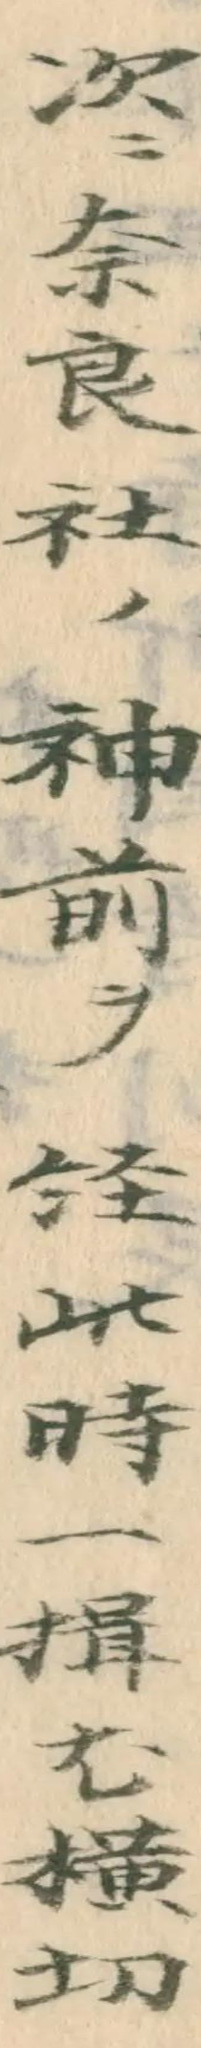次ニ奈良社ノ神前ヲ経此時一揖尤横切
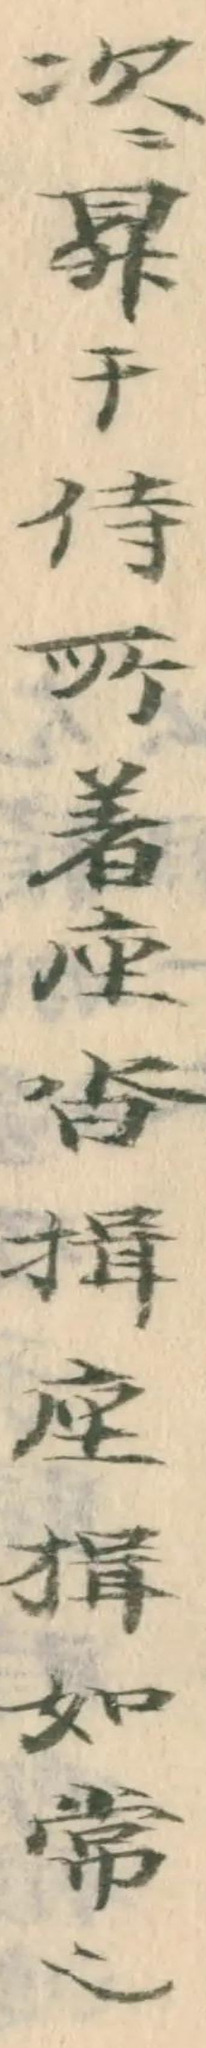次ニ昇于侍所着座沓揖座揖如常也
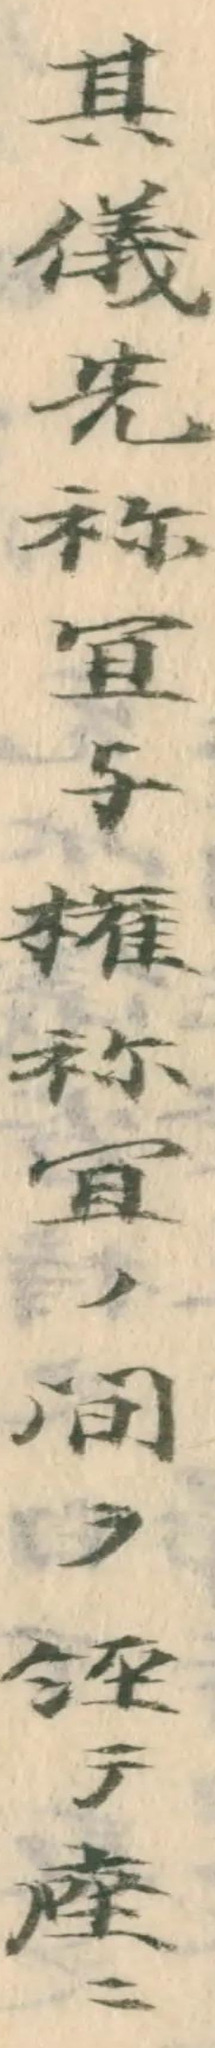其儀先祢宜与権祢宜ノ間ヲ経テ座ニ
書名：賀茂社記録. 第5冊
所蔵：国立国会図書館 National Diet Library, JAPAN
